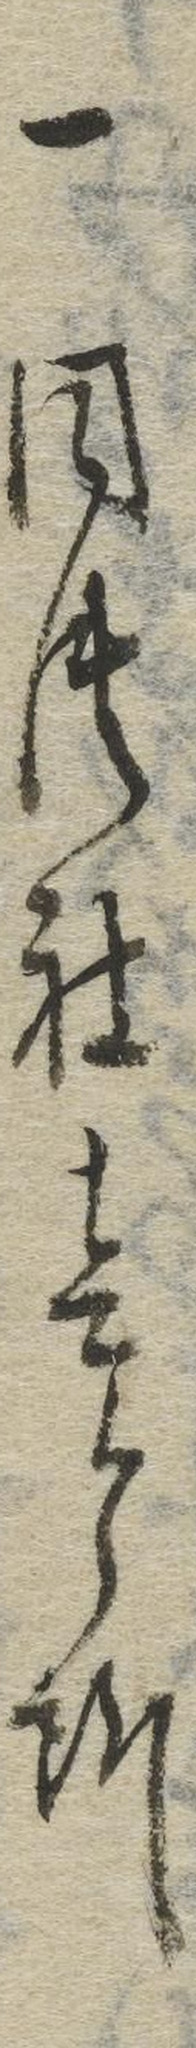一同潰社壱ヶ所
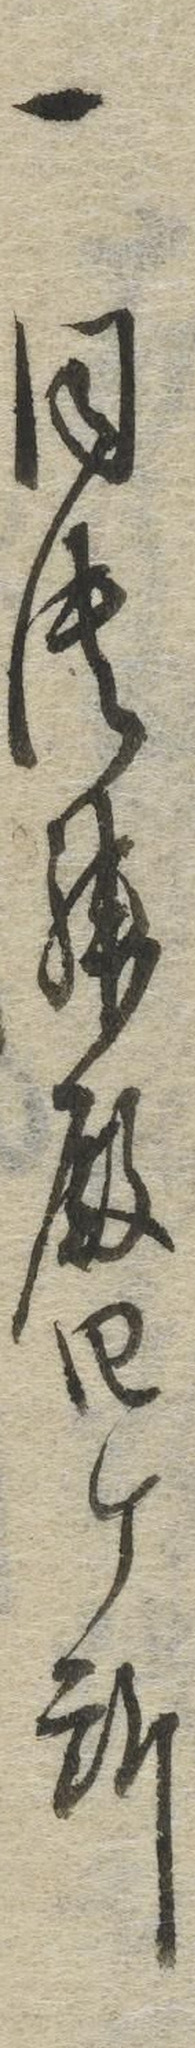一同潰拝殿四ヶ所
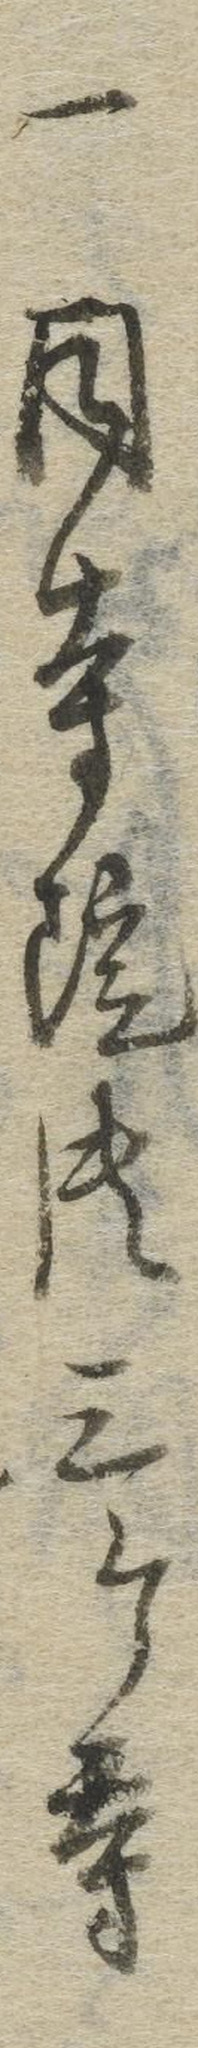一同寺院潰三ヶ所
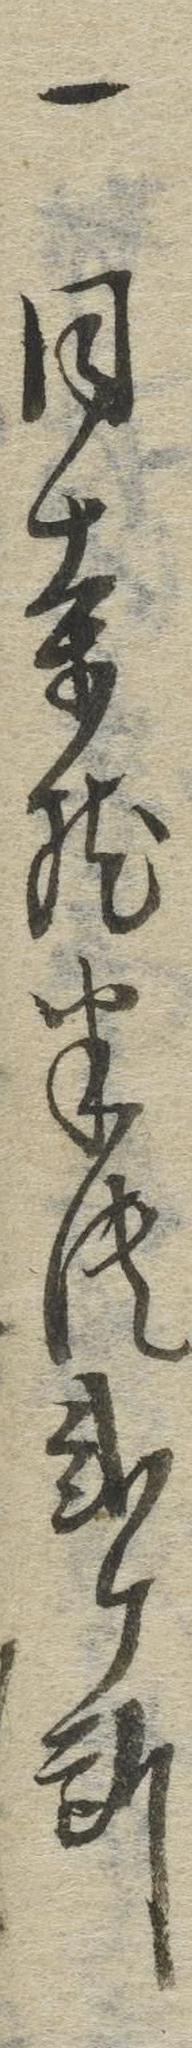一同寺蔵半潰弐ヶ所
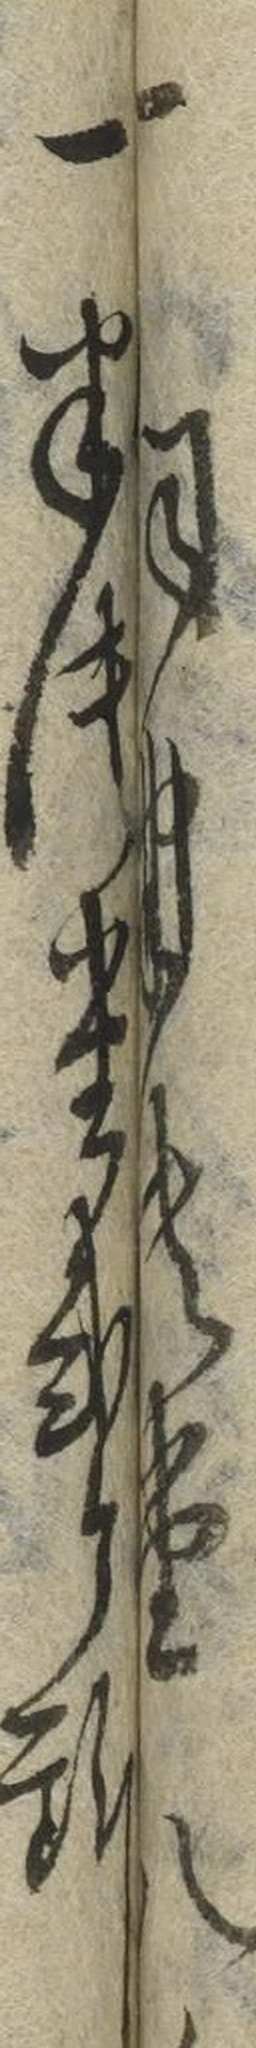一同半潰堂弐ヶ所
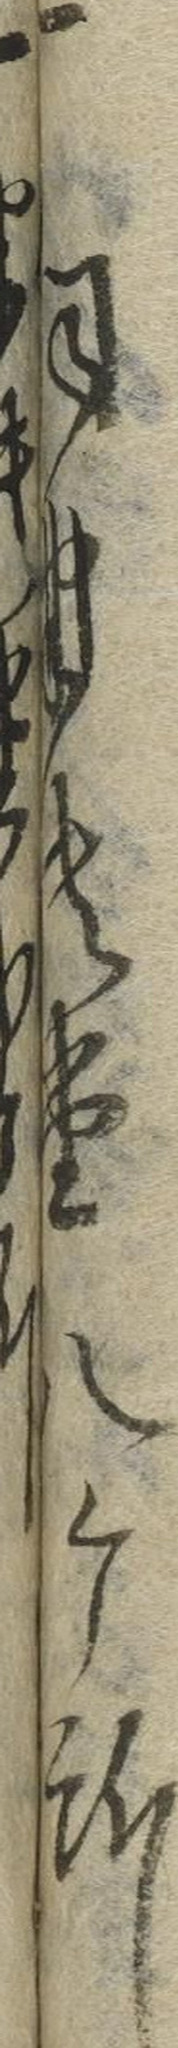一同潰堂八ヶ所
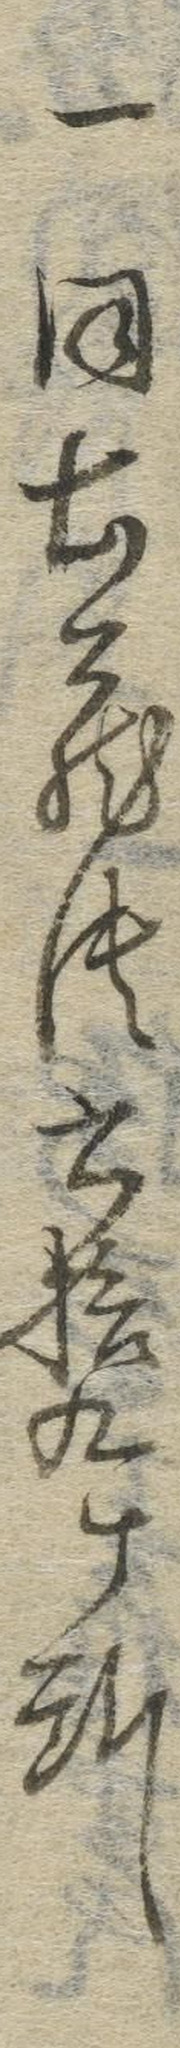一同土蔵潰六拾九ヶ所
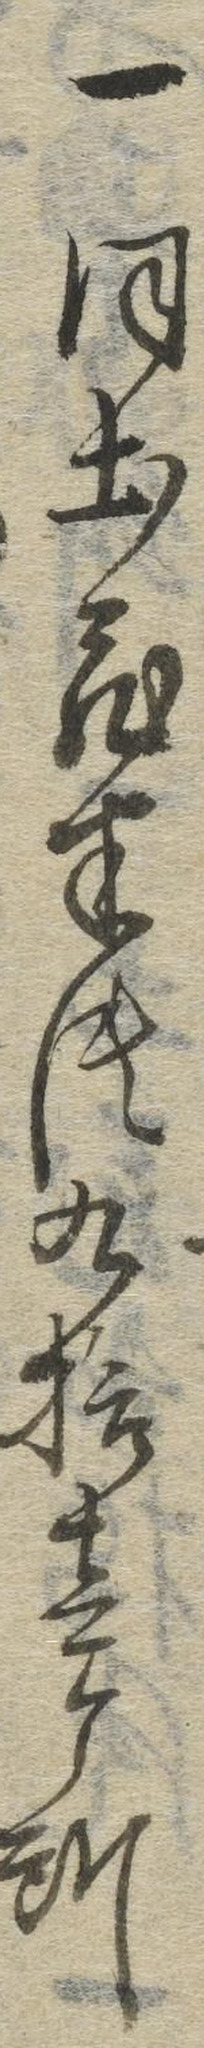一同土蔵半潰九拾壱ヶ所
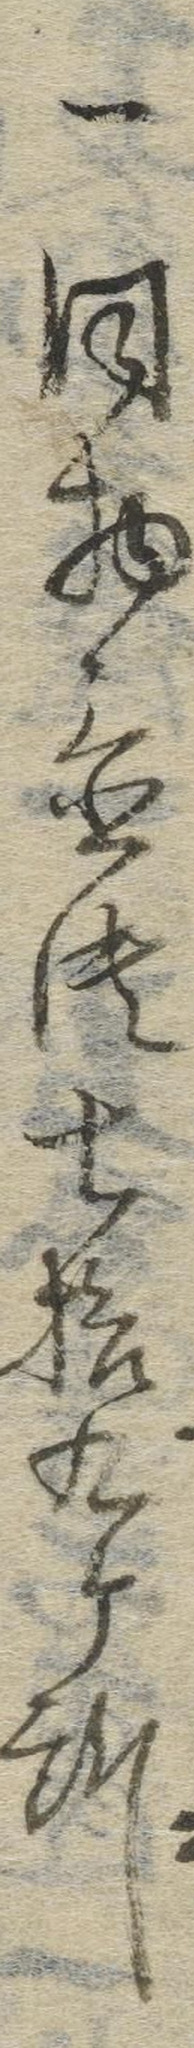一同物置潰七拾九ヶ所
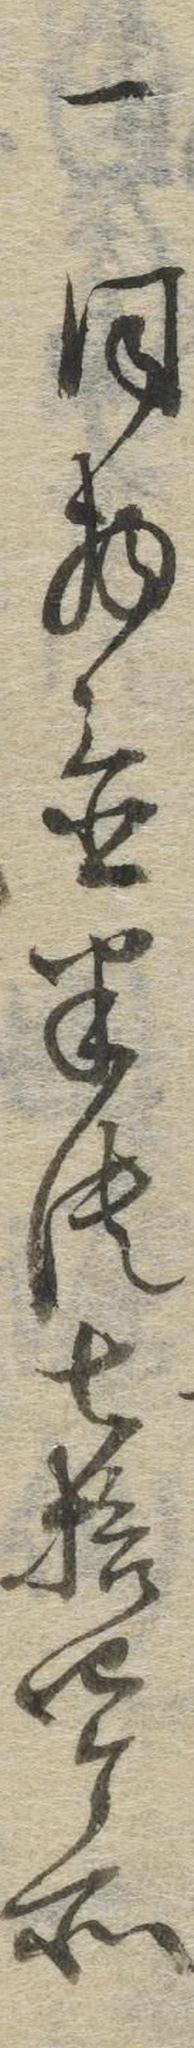一同物置半潰七拾四ヶ所
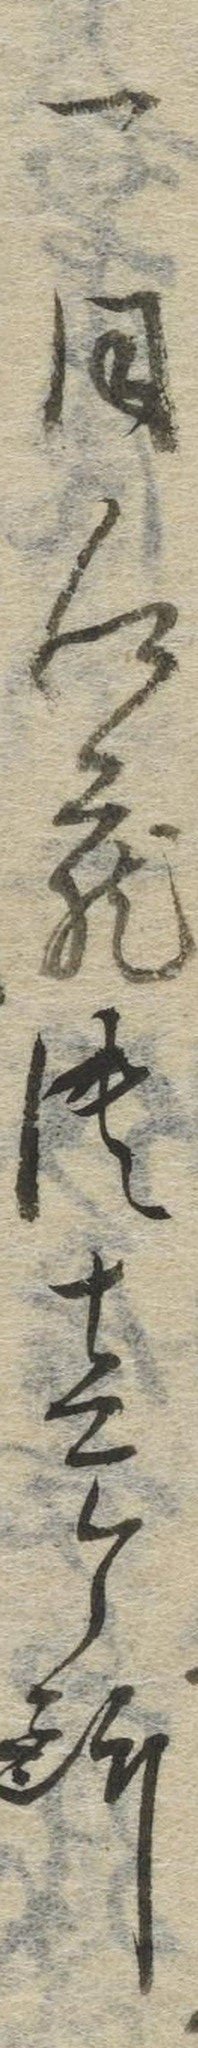一同寺蔵半潰弐ヶ所
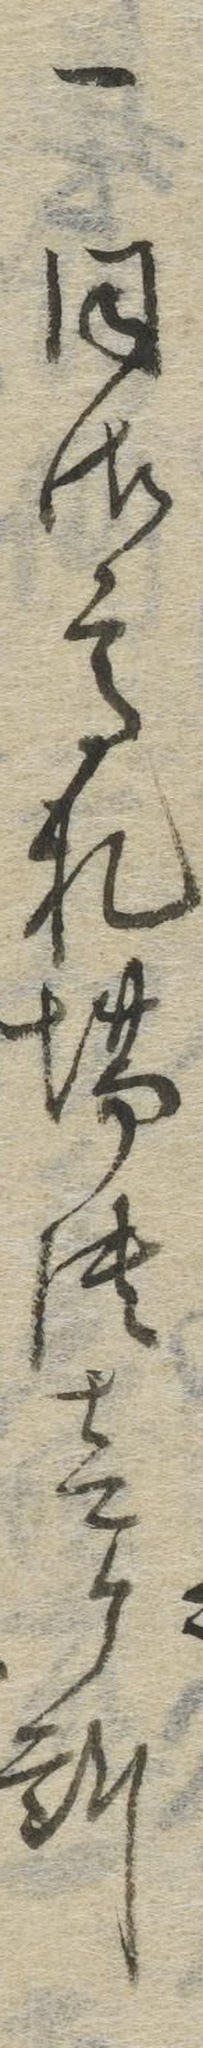一同御高札場潰壱ヶ所
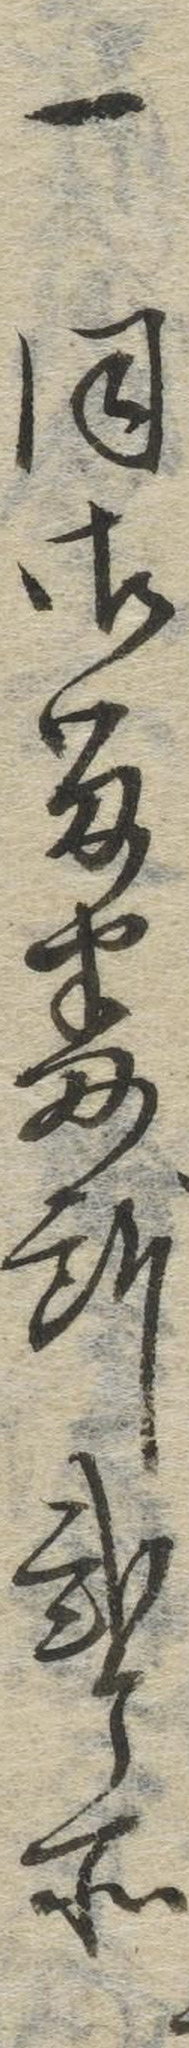一同御留番所弐ヶ所
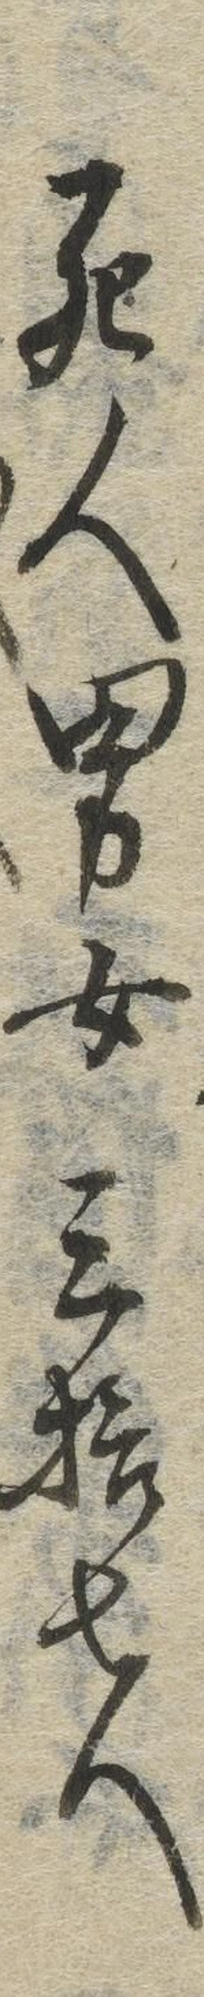一死人男女三拾七人
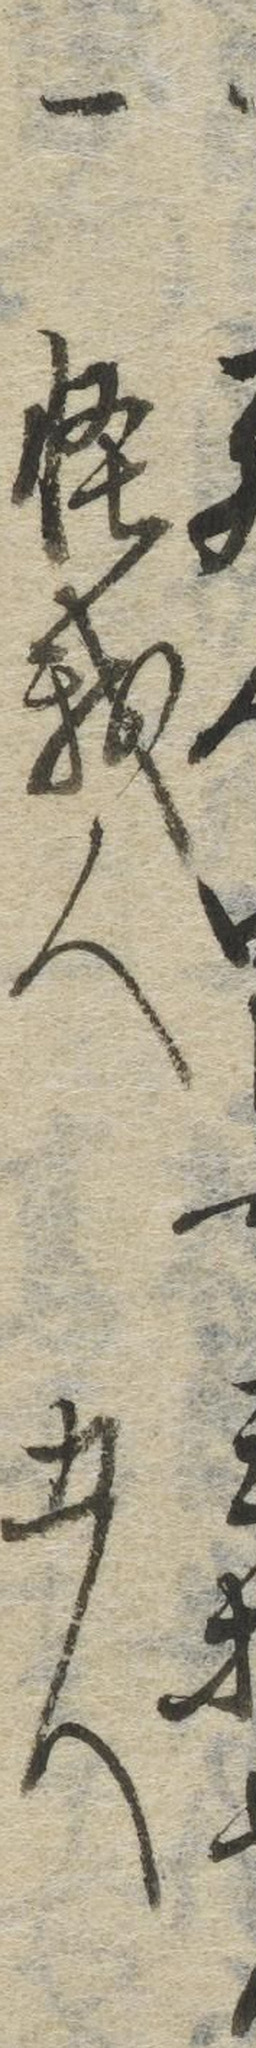一怪我人五人
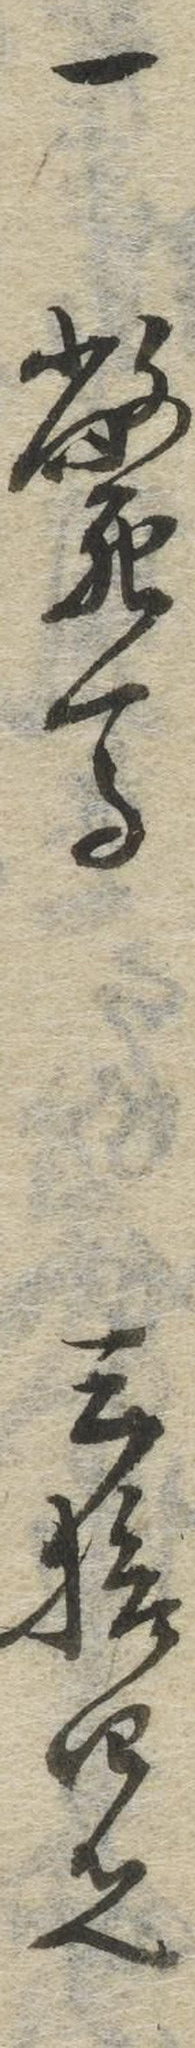一斃馬三拾四疋
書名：信濃越後　地震書留
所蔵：東京大学地震研究所図書室 Earthquake Research Institute Library, The University of Tokyo, JAPAN
